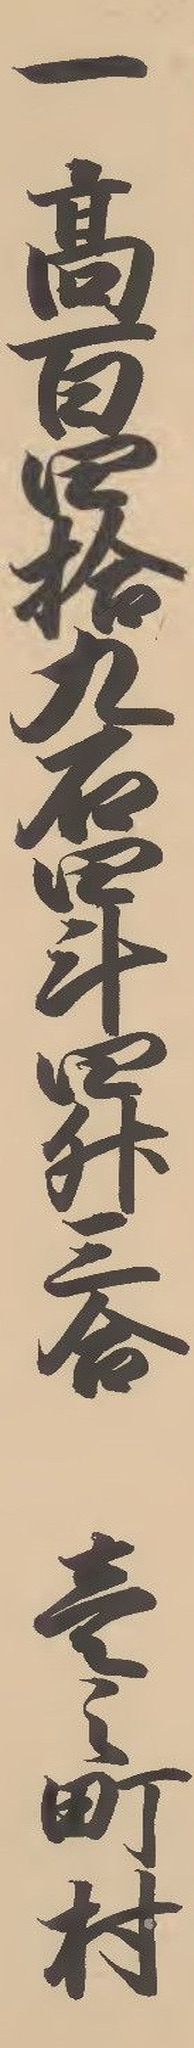一高百四拾九石四斗四升三合壱之町村
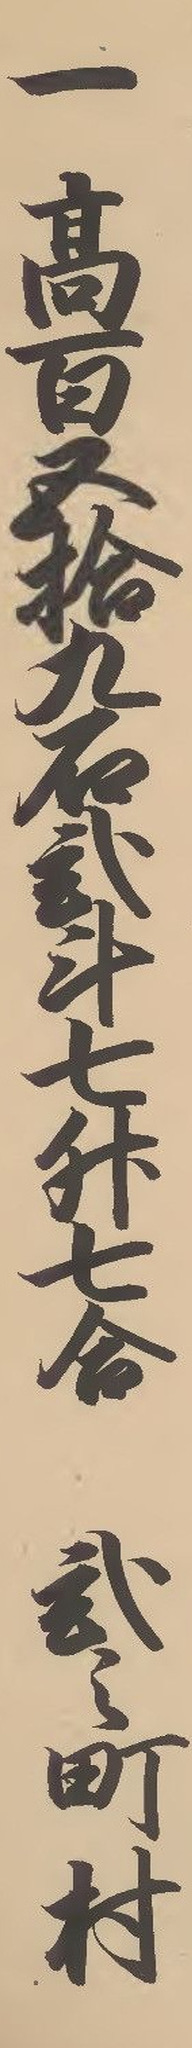一高百五拾九石弐斗七升七合弐之町村

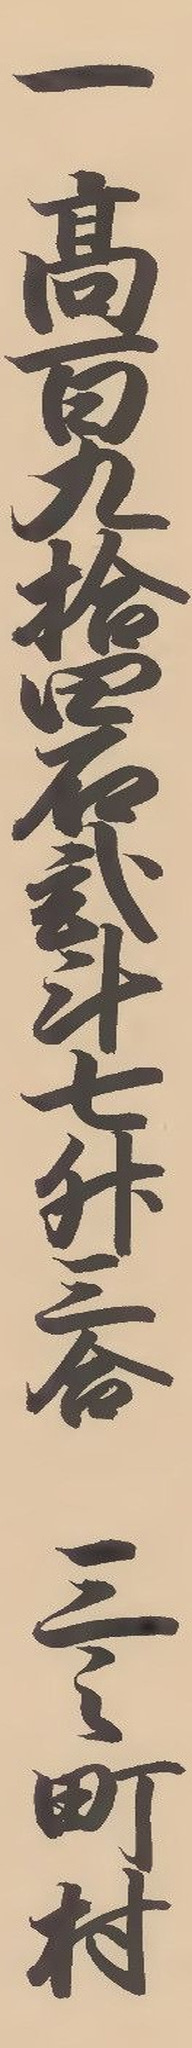一高百九拾四石弐斗七升三合三之町村
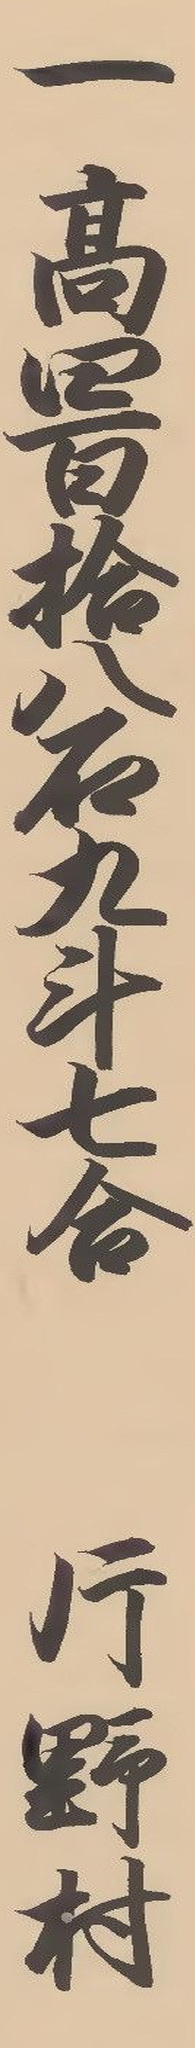一高四百拾八石九斗七合片野村
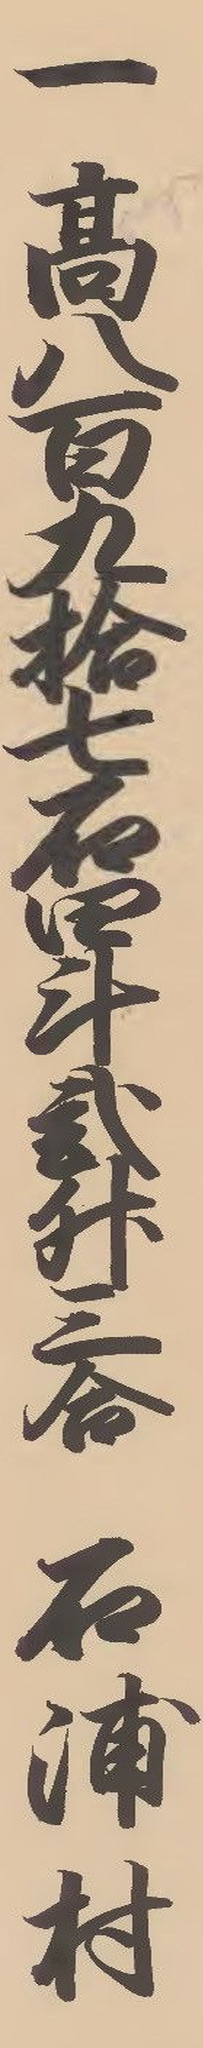一高八百九拾七石四斗弐升三合石浦村
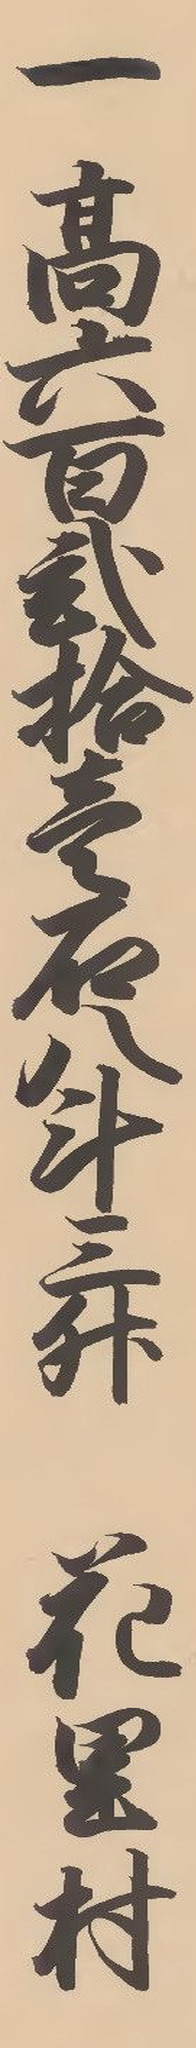一高六百弐拾壱石八斗三升花里村
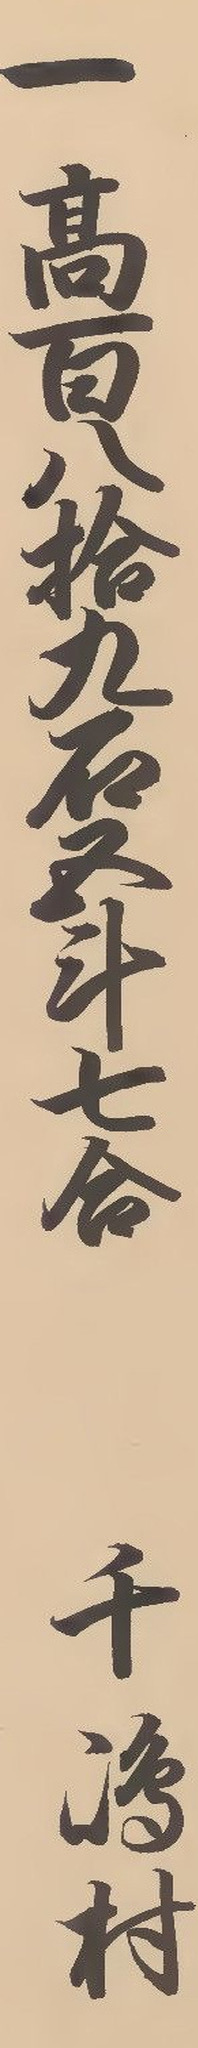一高百八拾九石五斗七合千島村
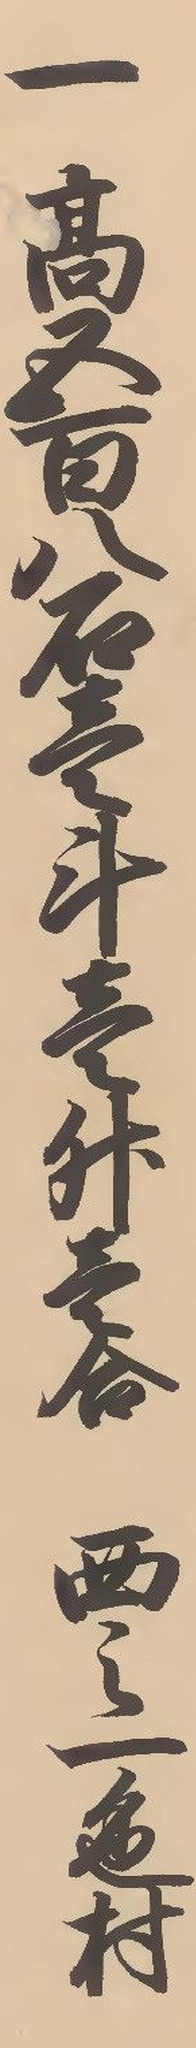一高五百八石壱斗壱升壱合西之一色村
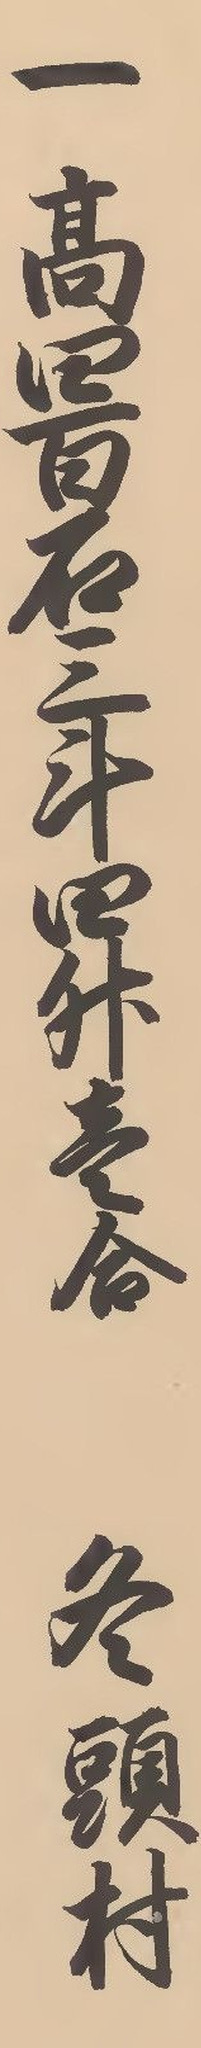一高四百石三斗四升壱合冬頭村
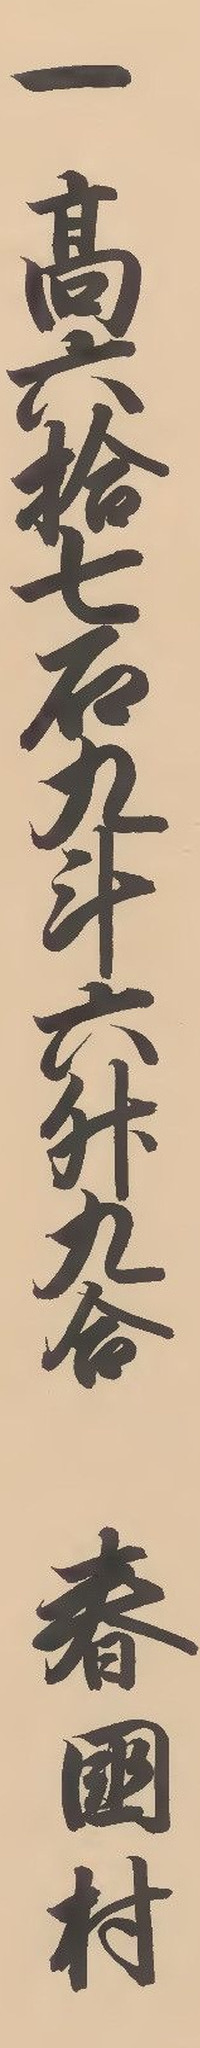一高六拾七石九斗六升九合春国村

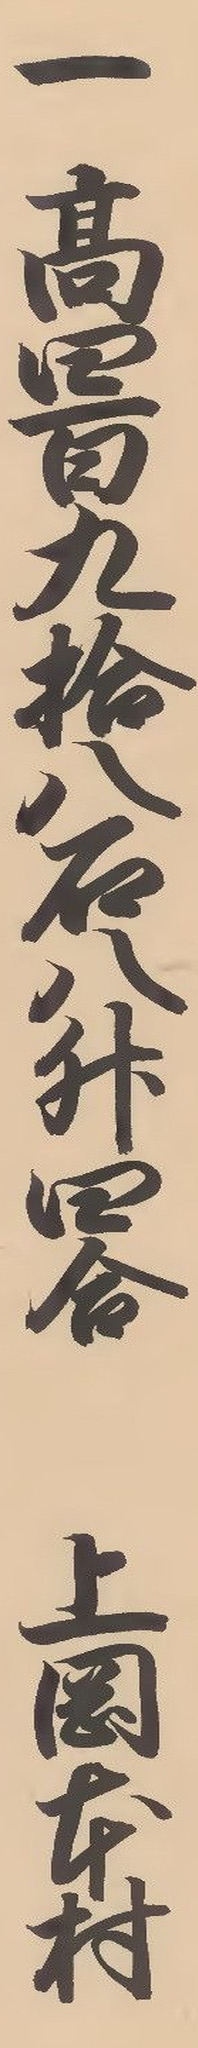一高四百九拾八石八升四合上岡本村
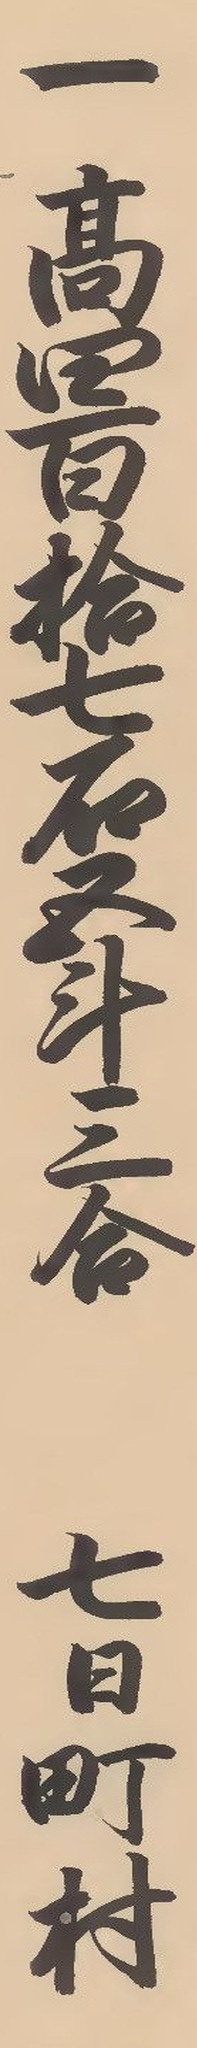一高四百拾七石五斗三合七日町村
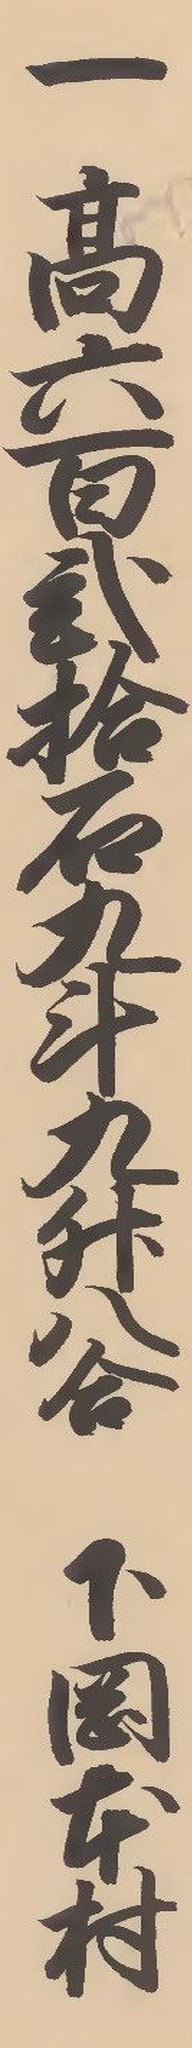一高六百弐拾石九斗九升八合下岡本村
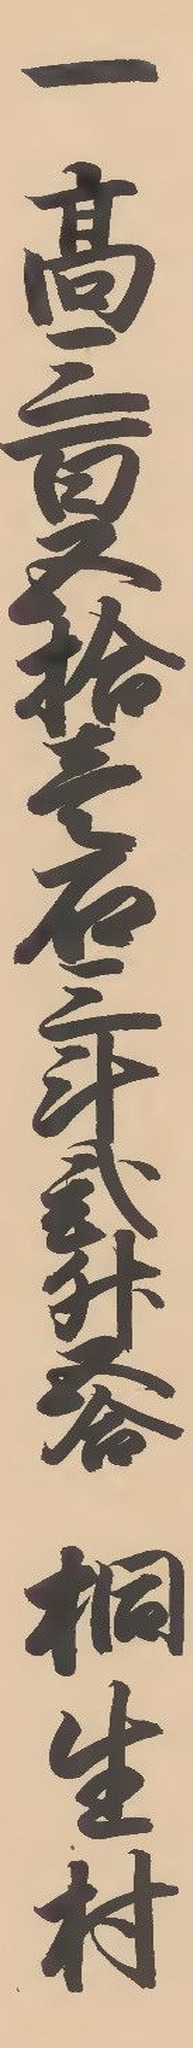一高三百五拾壱石三斗弐升五合相生村
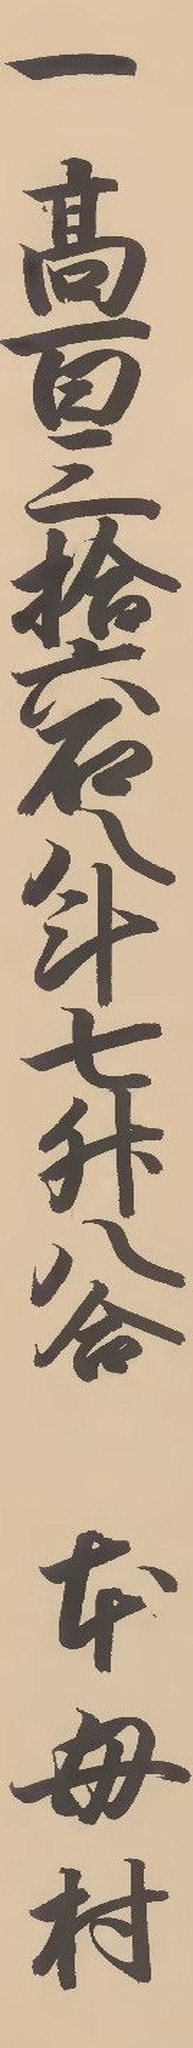一高百三拾六石八斗七升八合本母村
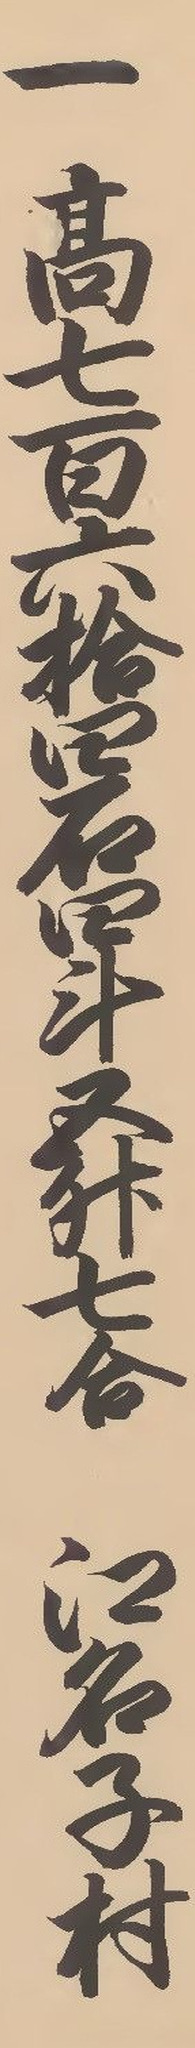一高七百六拾四石四斗五升七合江名子村
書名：飛騨国郷帳
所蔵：国立公文書館 National Archives of Japan
